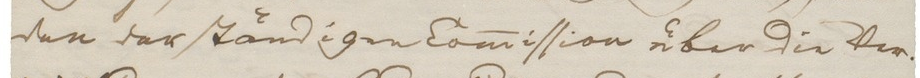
den der ständigen Commission über die Ver-
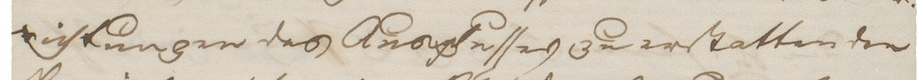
richtungen des Ausschusses zu erstattenden
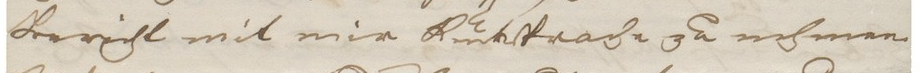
Bericht mit mir Rücksprache zu nehmen.
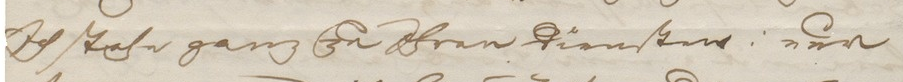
Ich stehe ganz zu Ihren Diensten: nur
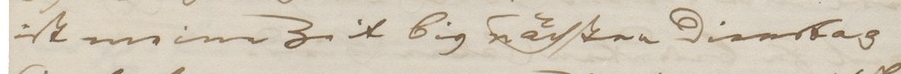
ist meine Zeit bis nächsten Dienstag
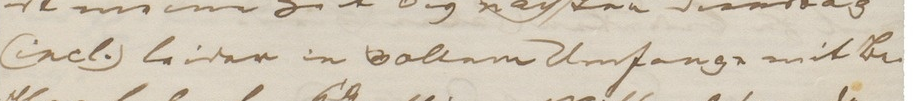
(incl.) leider in vollem Umfange mit Be-
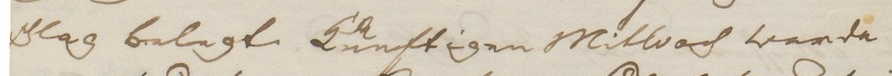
schlag belegt. Künftigen Mitwoch werde
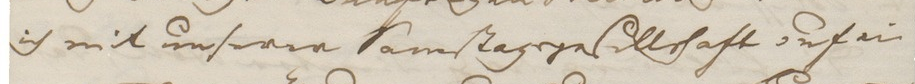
ich mit unserer Samstagsgesellschaft auf ei-
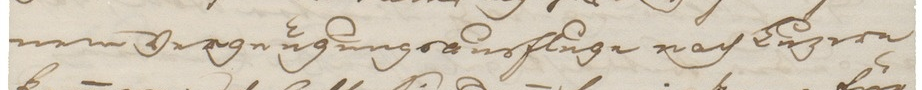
nem Vergnügungsausfluge nach Luzern
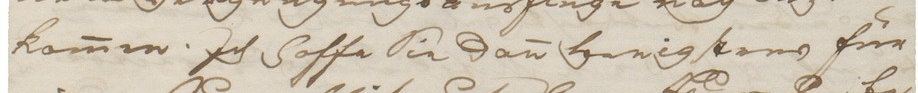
kommen. Ich hoffe Sie dann wenigstens für
